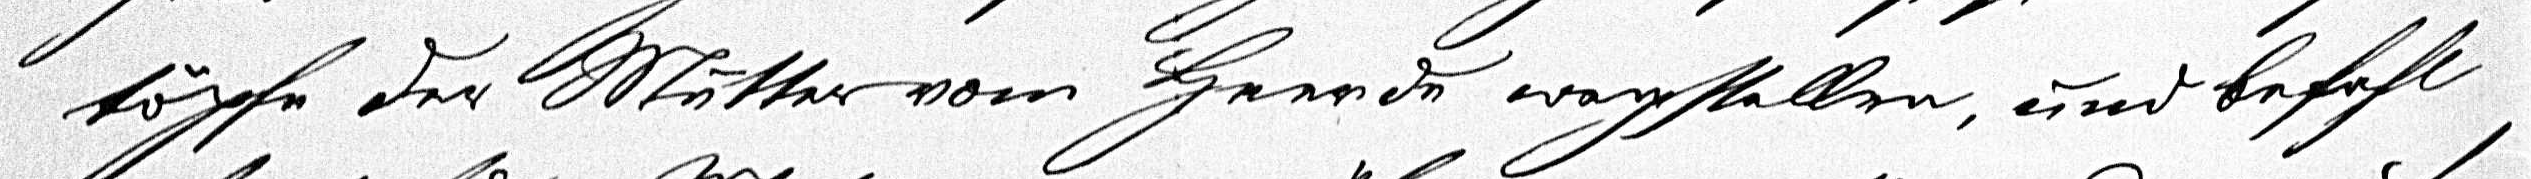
töpfe der Mutter vom Heerde wegstellen, und befahl
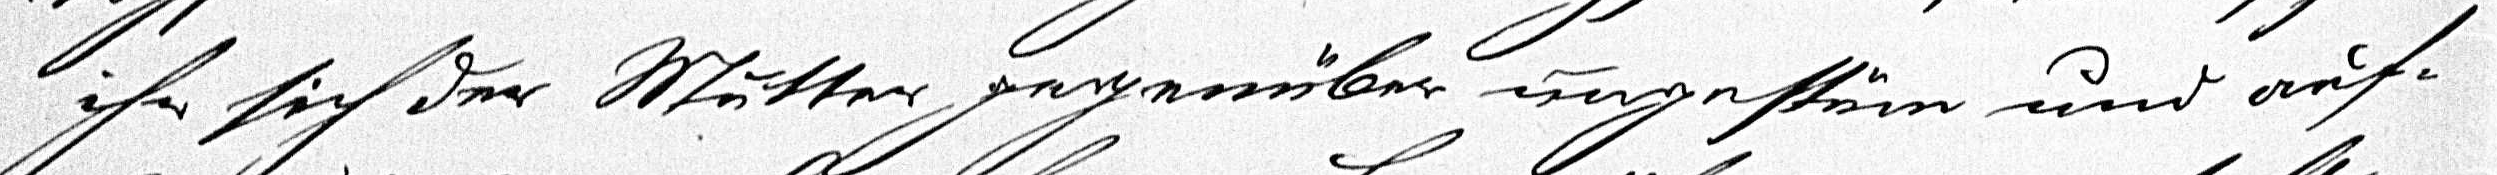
ihr sich der Mutter gegenüber ungestüm und auf¬
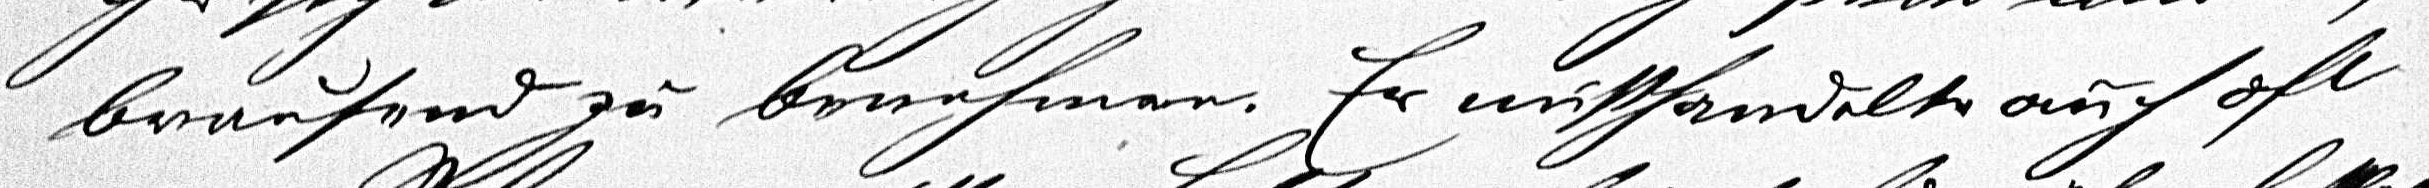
brausend zu benehmen. Er mißhandelte auch oft
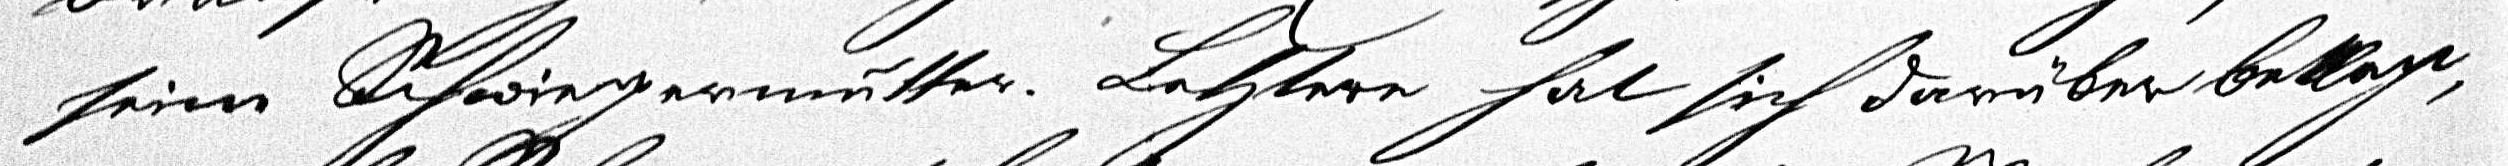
seine Schiwegermutter. Letztere hat sich darüber beklagt,
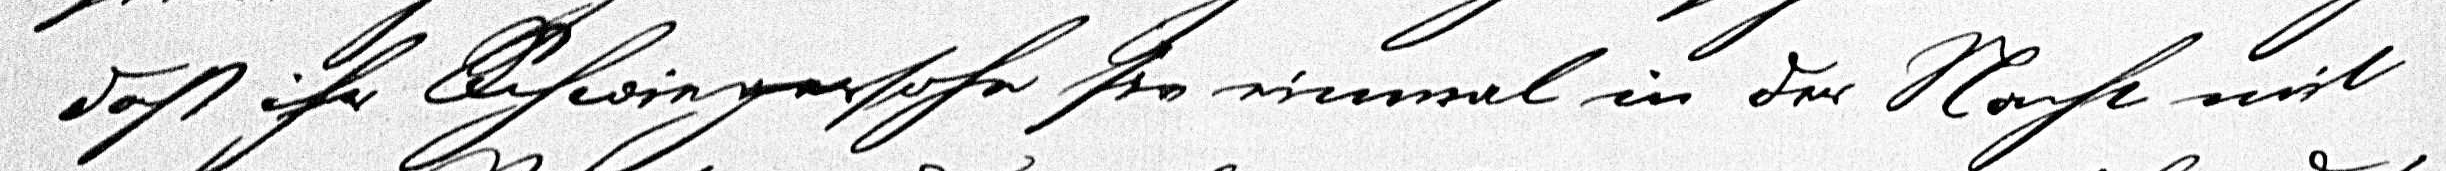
daß ihr Schwiegersohn sie einmal in der Nacht mit
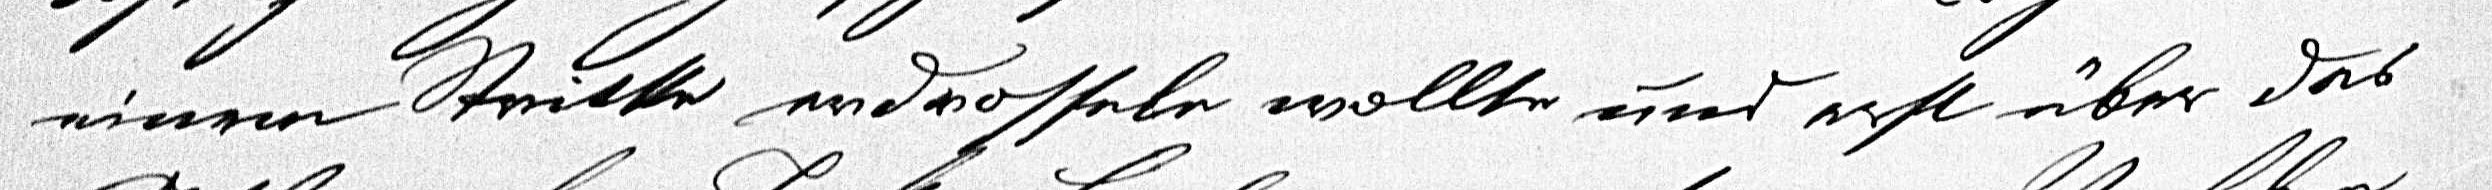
einem Stricke erdrosseln wollte und erst über das
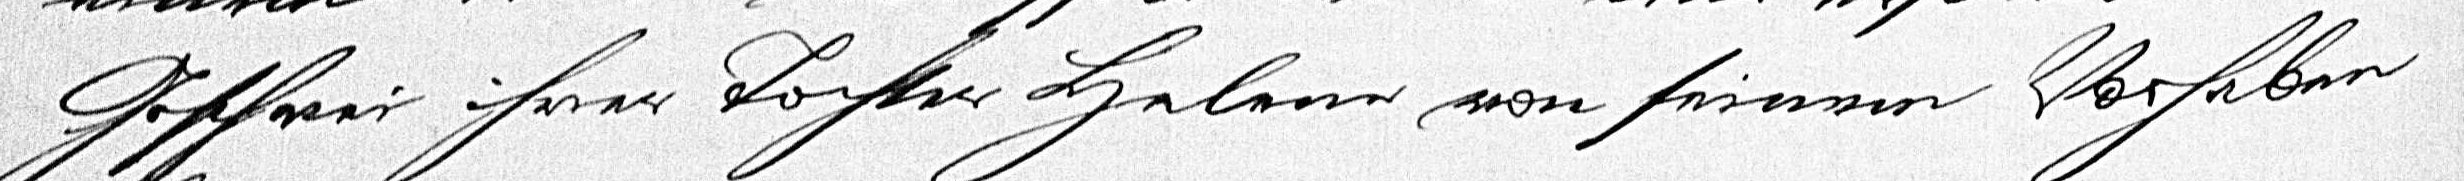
Geschrei ihrer Tochter Helene von seinem Vorhaben
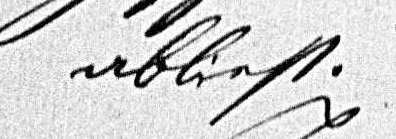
abließ.
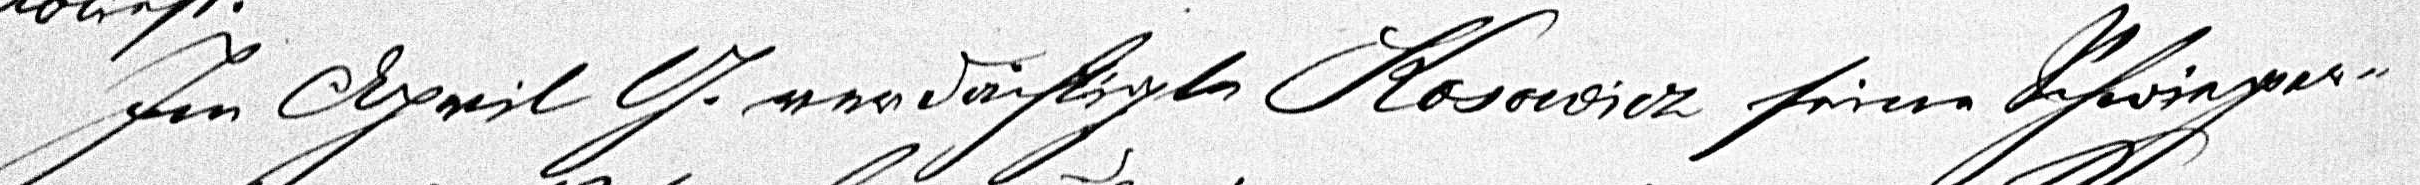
Im April lJ. Verdächtigte Kosowicz seine Schwieger¬
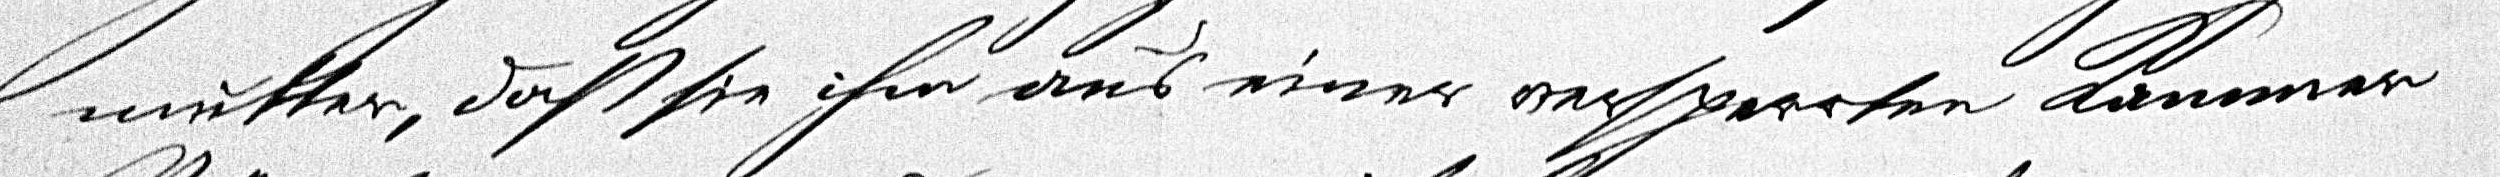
mutter, daß sie ihm aus einer versperrten Kammer
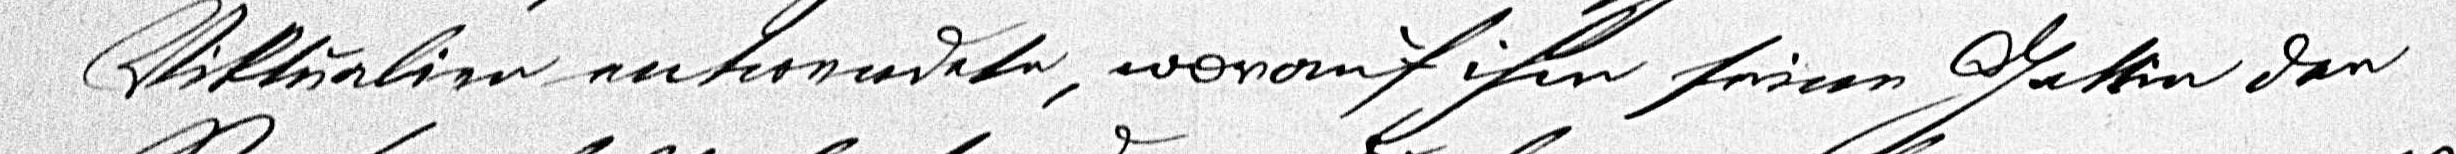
Viktualien entwendete, worauf ihm seine Gattin den
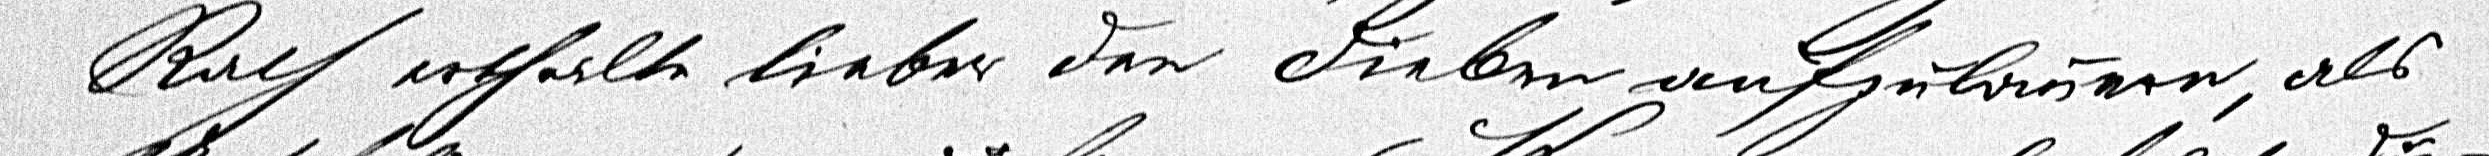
Rath ertheilte lieber den Dieben aufzulauern, als
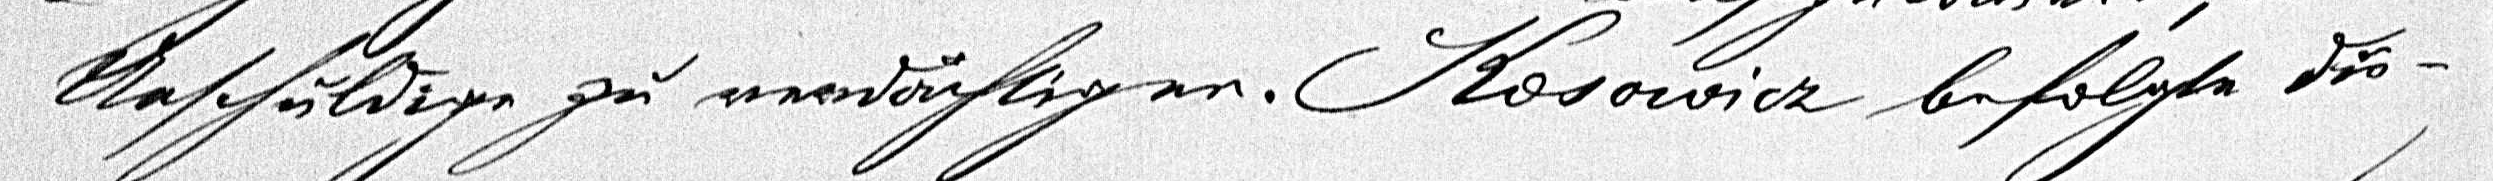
Unschuldige zu verdächtigen. Kosowicz befolgte die¬
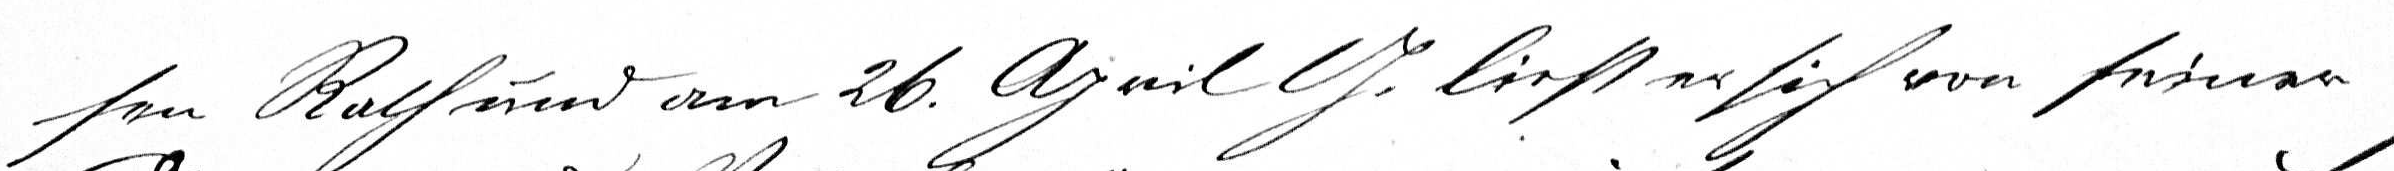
sen Rath und am 26. April lJ. ließ er sich von seiner
